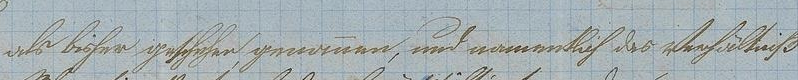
als bisher geschehen, genommen, und namentlich das Verhältniß
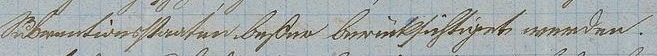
Subventionsstaaten besser berücksichtigt werden.
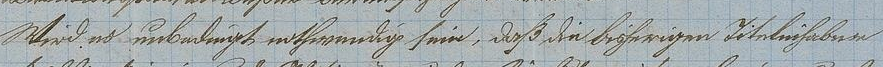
Wird es unbedingt nothwendig sein, daß die bisherigen Titelinhaber
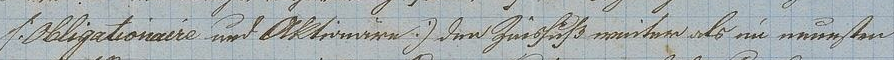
(Obligationaire und Aktionäre) den Zinsfuß weiter als im neuesten
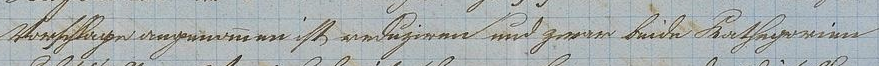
Vorschlage angenommen ist reduziren und zwar beide Kathegorien
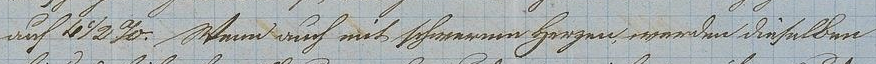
auf 4½%. Wenn auch mit schwerem Herzen, werden dieselben
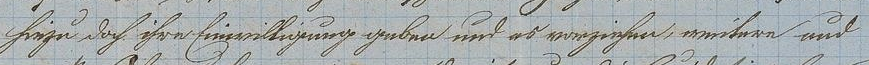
hiezu doch ihre Einwilligung geben und es vorziehen, weitere und
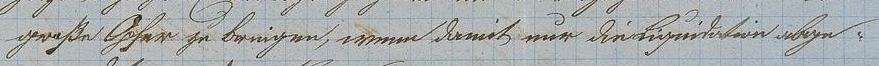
große Opfer zu bringen, wenn damit nur die Liquidation abge-
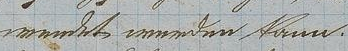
wendet werden kann.
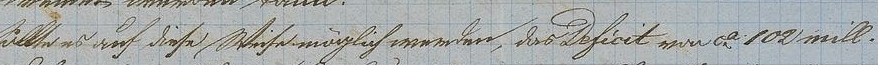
Sollte es auf diese Weise möglich werden, das Deficit von ca 102 mill.
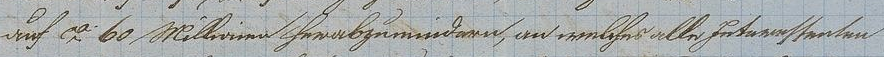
auf ca 60 Millionen herabzumindern, an welches alle Interessenten
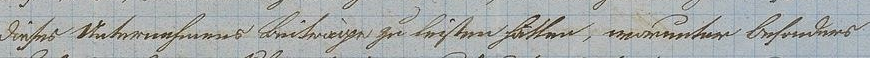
dieses Unternehmens Beiträge zu leisten hätten, worunter besonders
